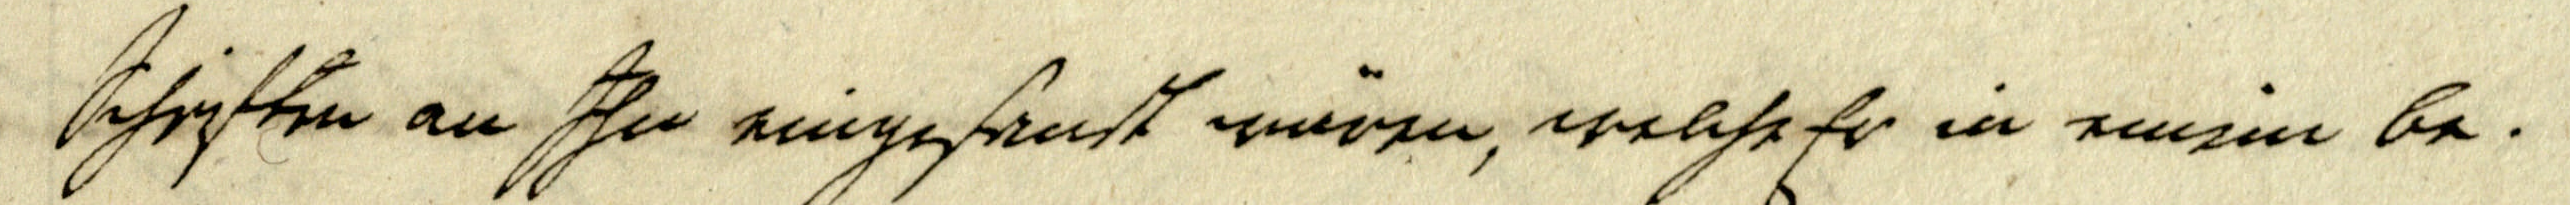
Schriften an Ihn eingesandt wären, welche Er in einem be¬
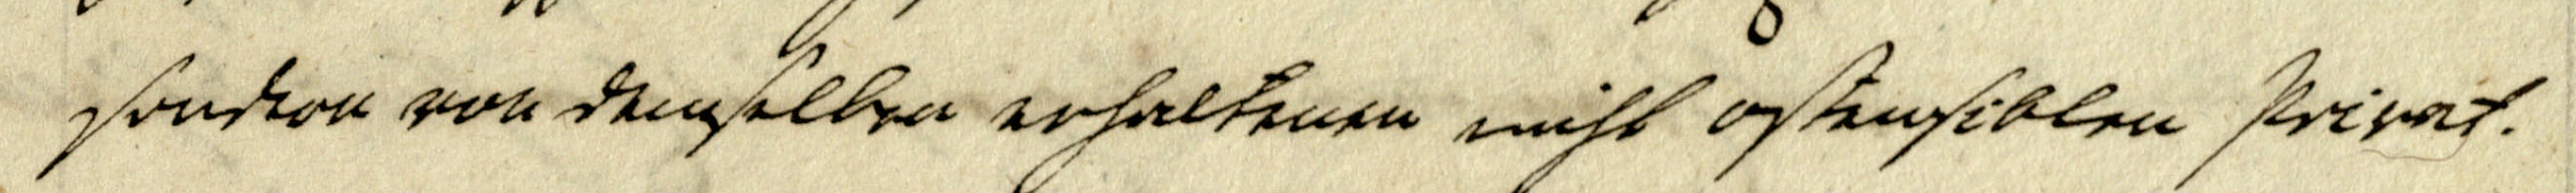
sondern von demselben erhaltenen nicht ofensiblen Privat¬
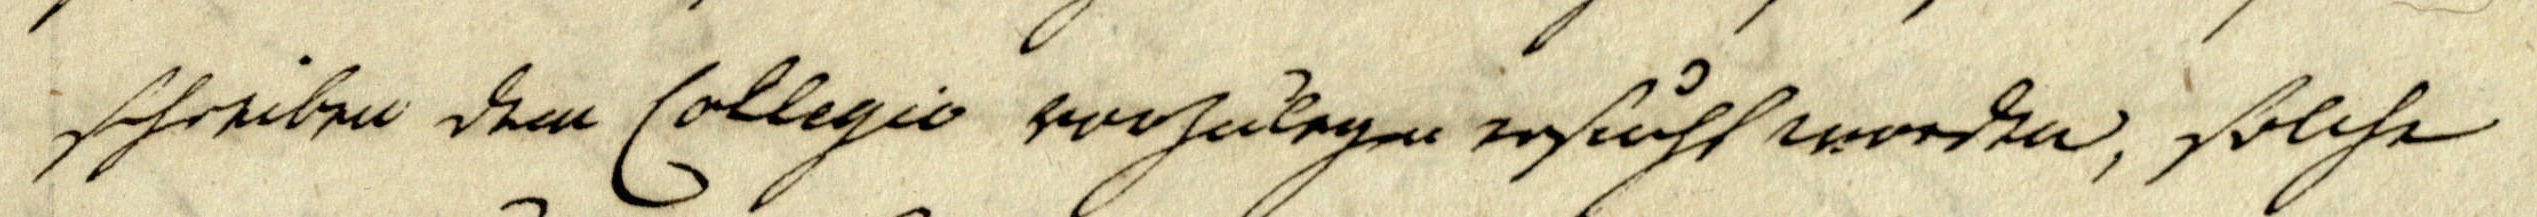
schreiben dem Collegio vorzulegen ersucht worden, solche
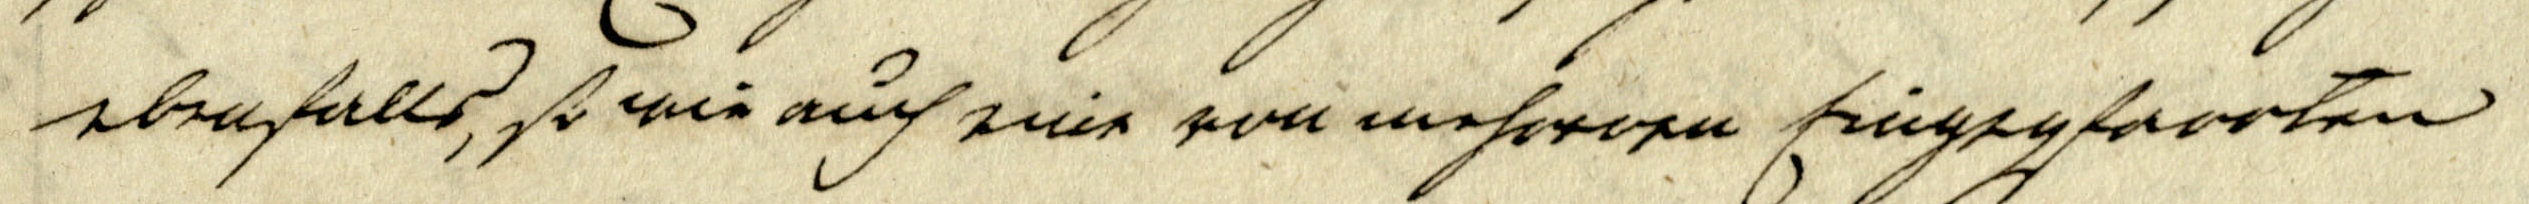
ebenfalls, so wie auch eine von mehreren Eingepfarrten
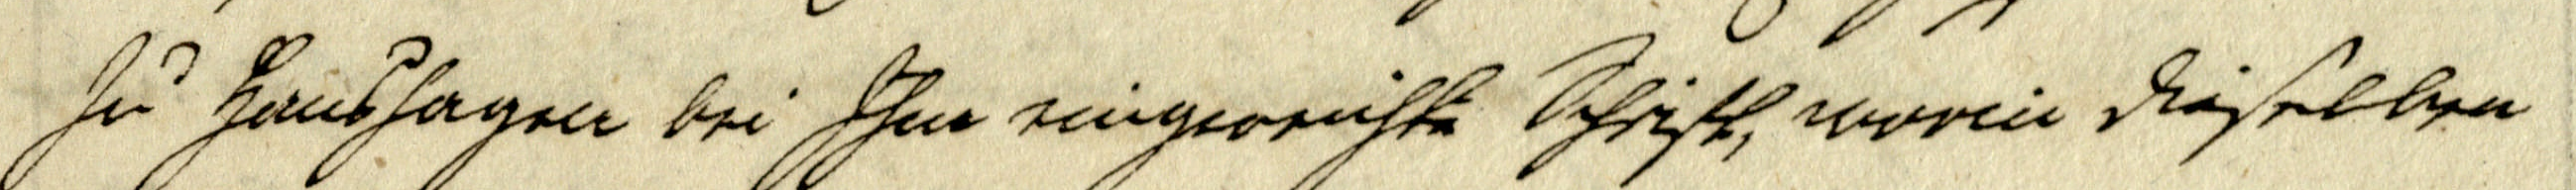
zu Hanshagen bei Ihm eingereichte Schrift, worin dieselben
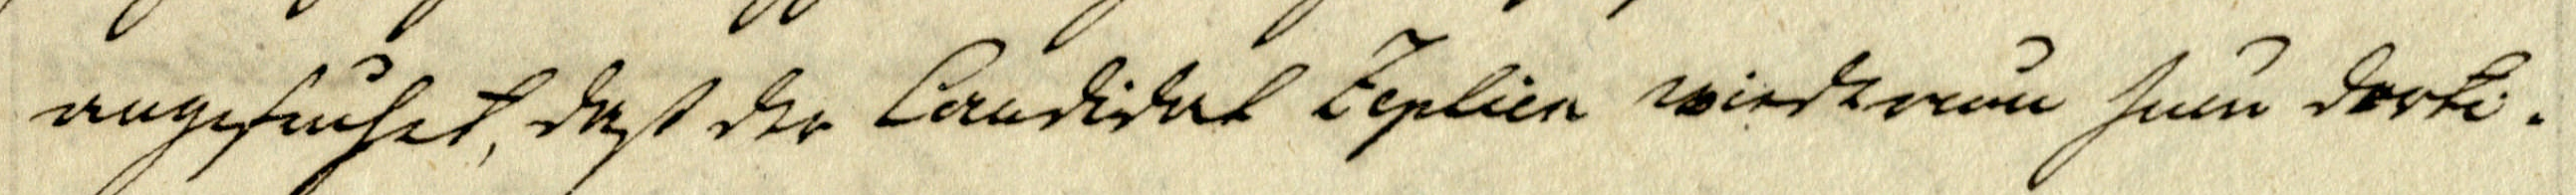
angesuchet, daß der Candidat Zeplien wiederum zum dorti¬
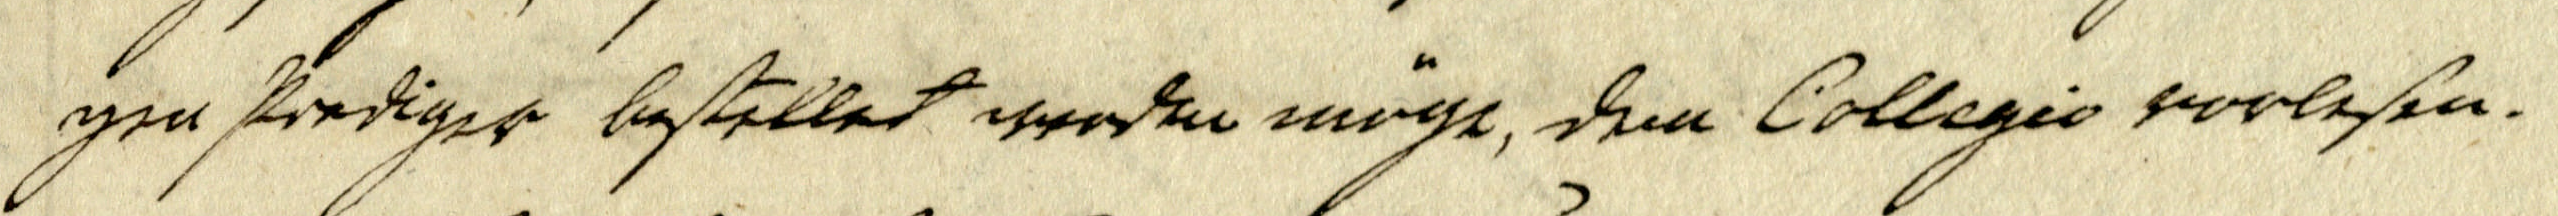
gen Prediger bestellet werden möge, dem Collegio vorlesen.
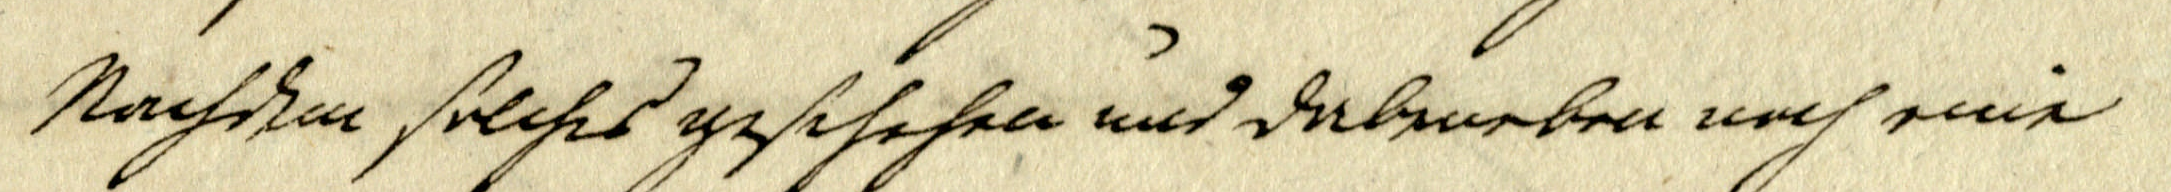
Nachdem solches geschehen und dabeneben noch eine
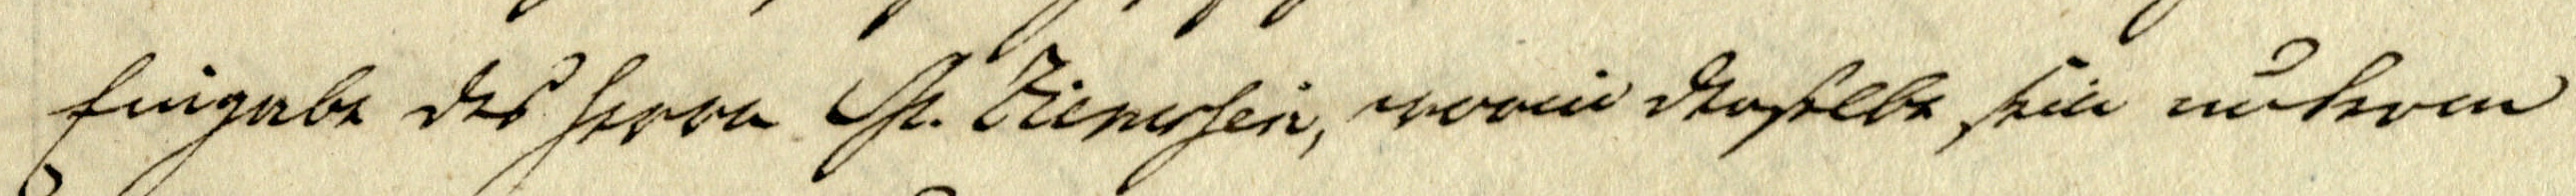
Eingabe des herrn M. Ziemssen, worin derselbe sein unterm
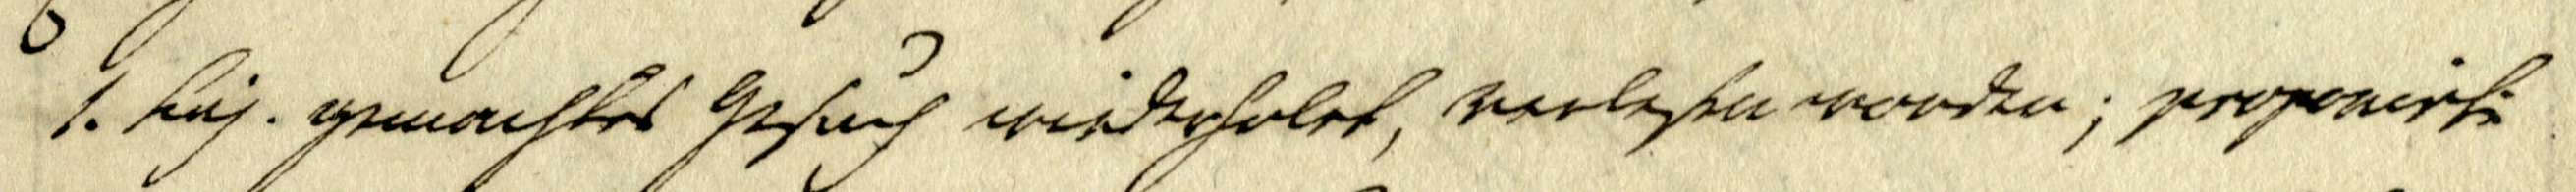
1. huj. gemachtes Gesuch wiederholt, verlesen worden; proponirte
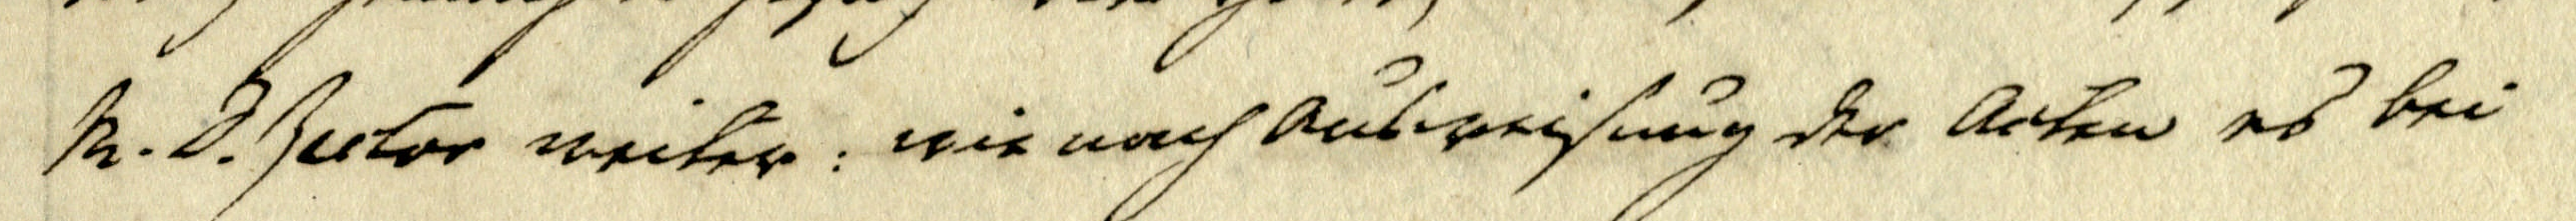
M. D. Rector weiter: wie nach Ausweisung der Acten es bei
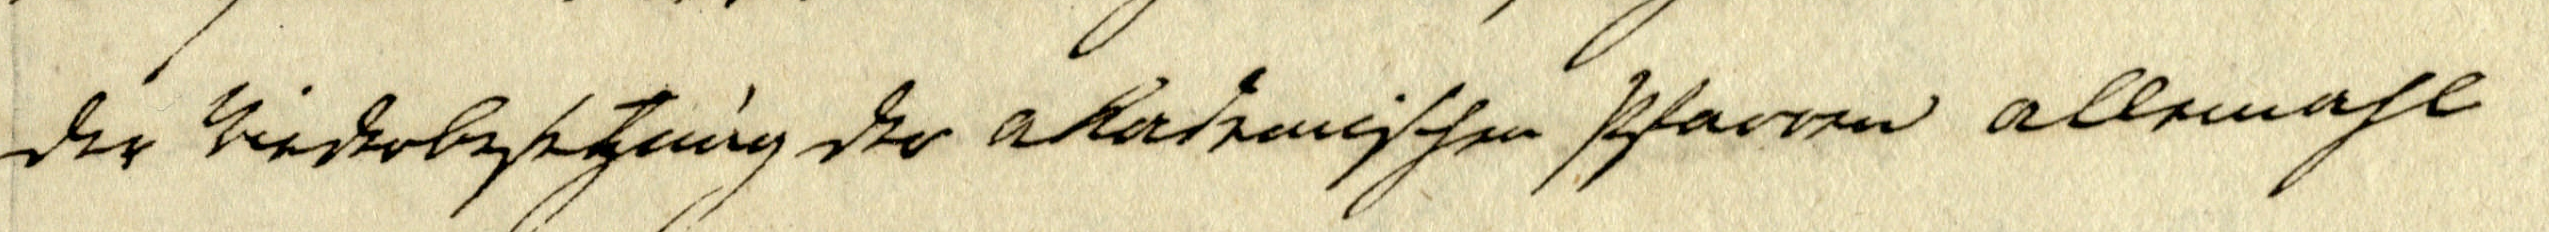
der Wiederbesetzung der akademischen Pfarren allemahl
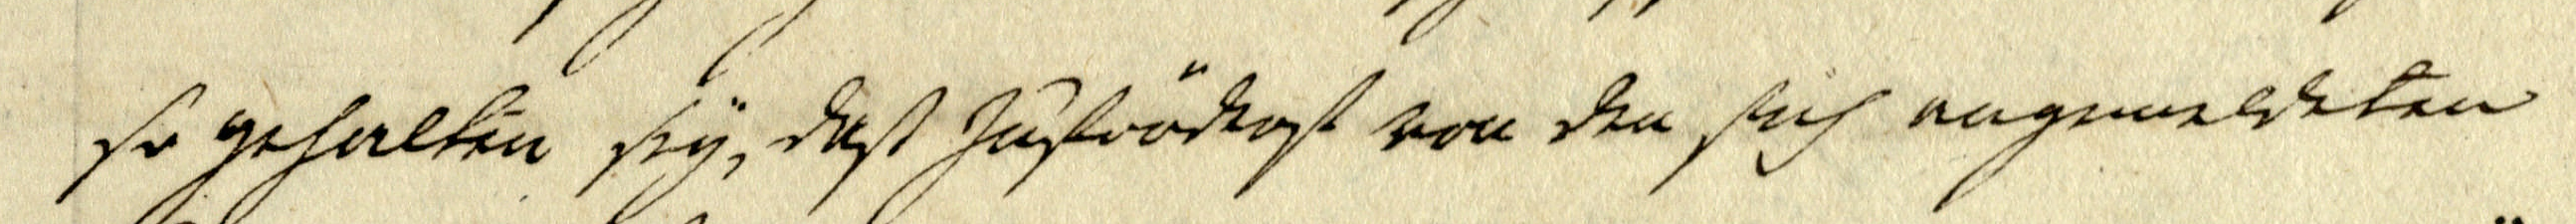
so gehalten seÿ, daß zuförderst von den sich angemeldeten
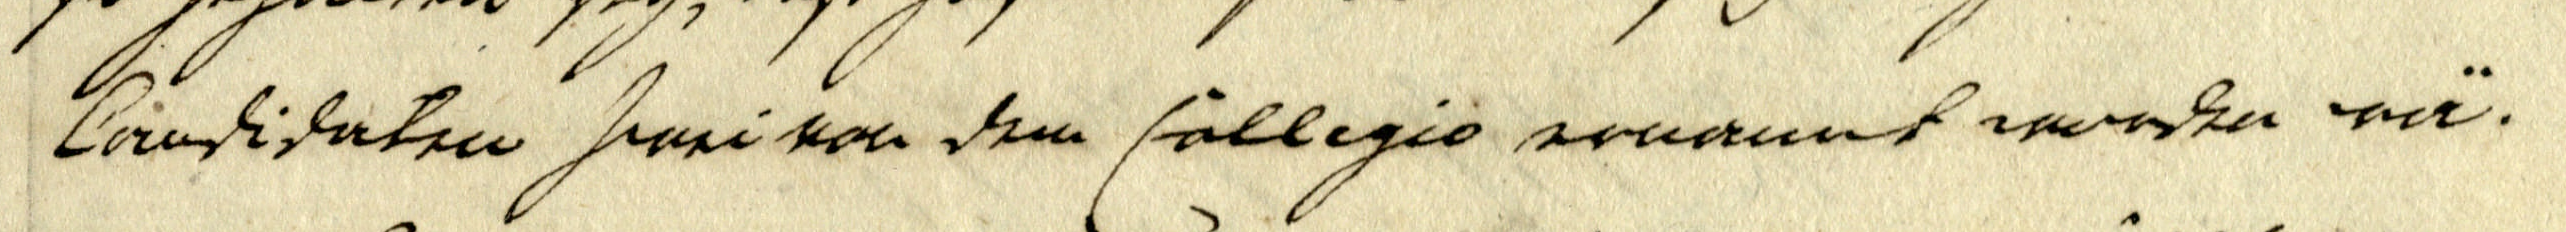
Candidaten zwei von dem Collegio ernannt worden wä¬
